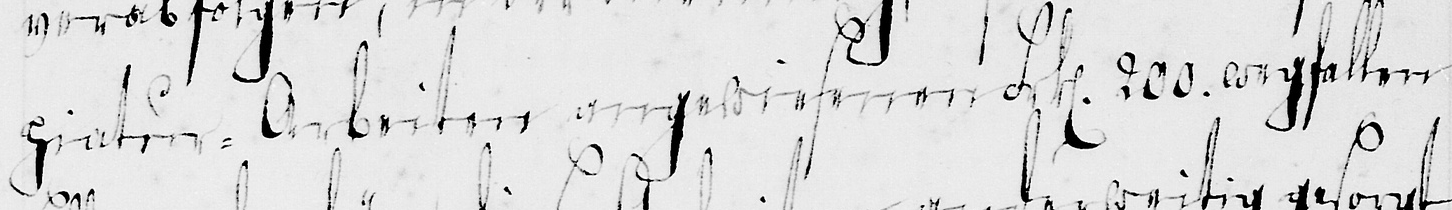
piatur-Arbeiten angewiesenen Frk[en]. 200. wegfallen
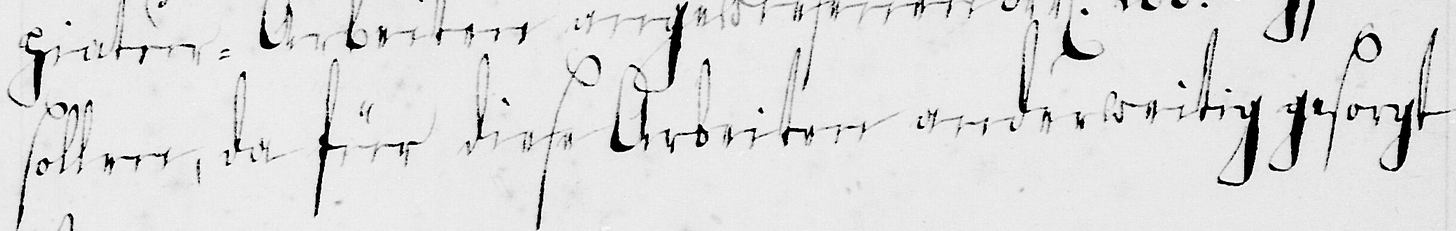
sollen, da für diese Arbeiten anderweitig gesorgt
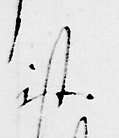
ist.
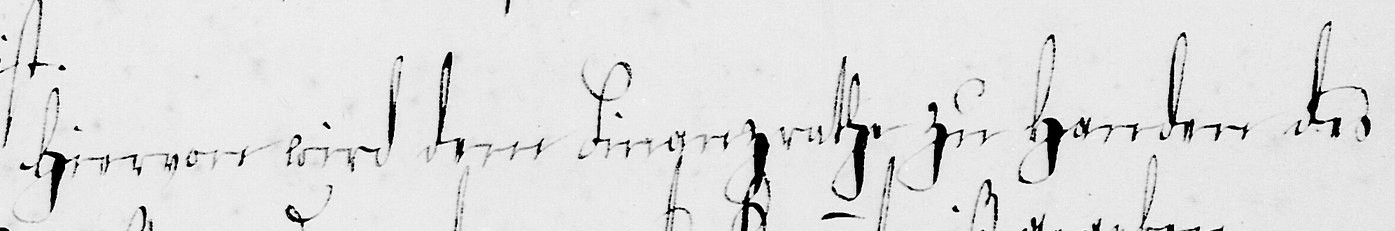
Hiervon wird dem Finanzrathe zu Handen des
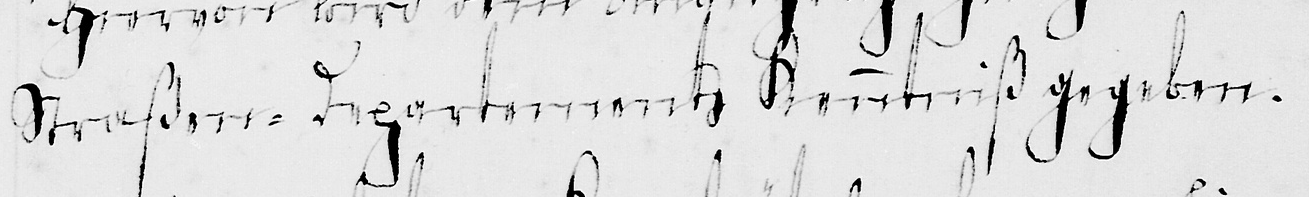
Straßen-Departements Kenntniß gegeben.
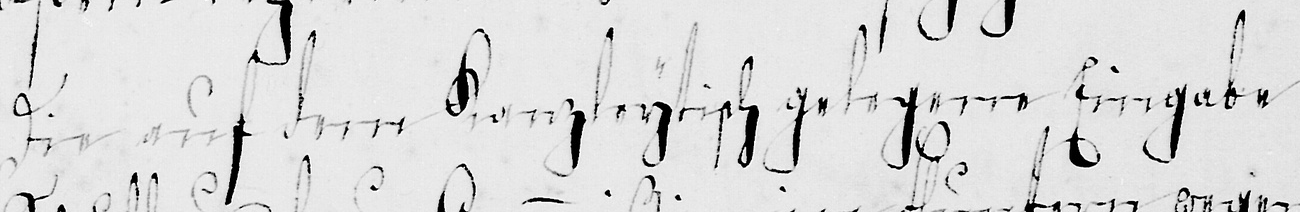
Die auf dem Kanzleytisch gelegene Eingabe
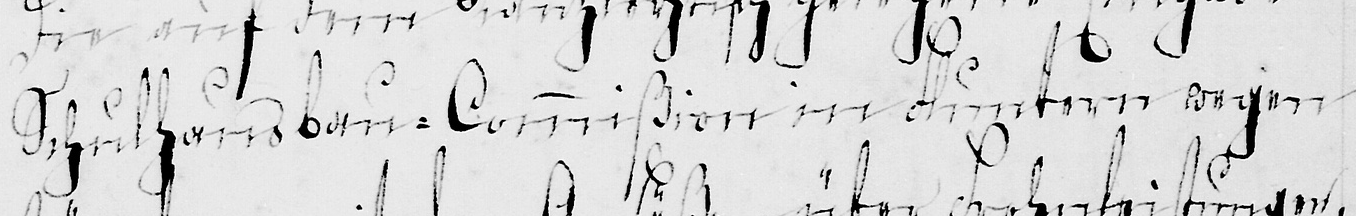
Schulhausbau-Commißion in Fluntern wegen
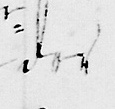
der
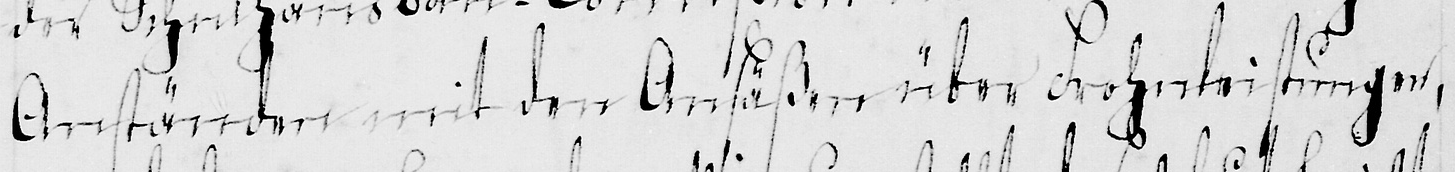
Anständen mit den Ansäßen über Frohnleistungen,
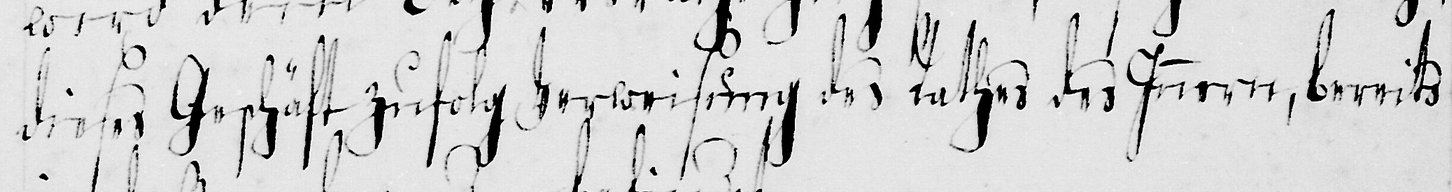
dieses Geschäft zufolg Verweisung des Rathes des Innern, bereits
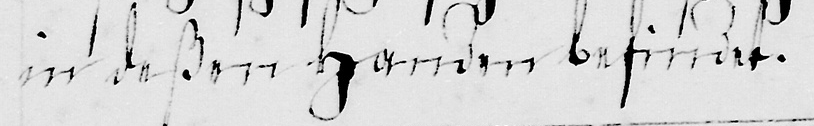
in deßen Handen befindet.
